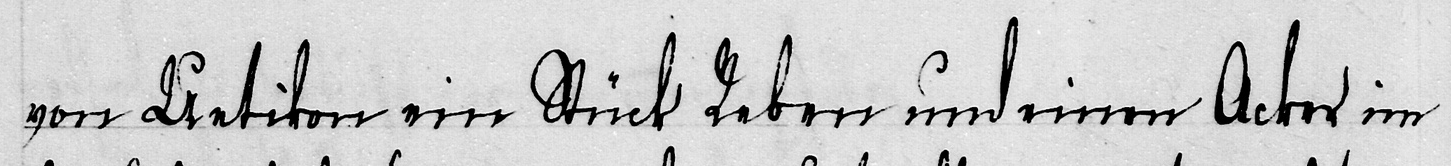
von Uetikon ein Stück Reben und einen Acker im
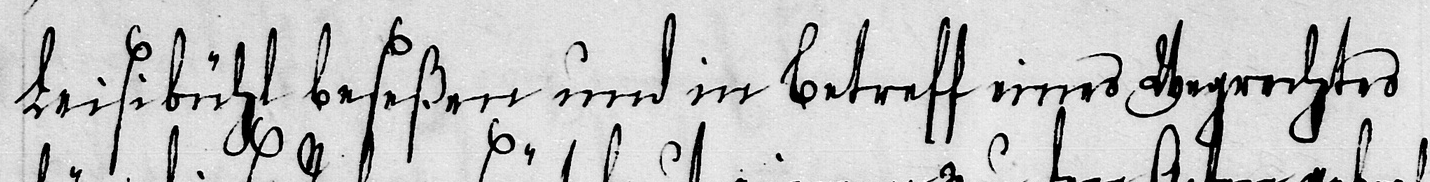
Leisibühl beseßen und in Betreff eines Wegrechtes
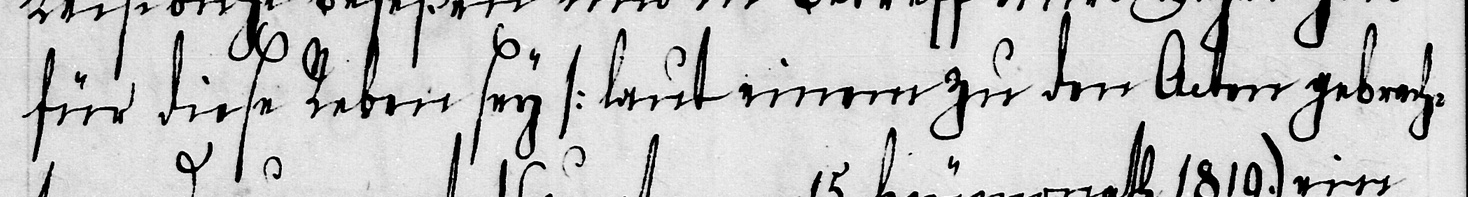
für diese Reben sey [laut einem zu den Acten gebrach¬
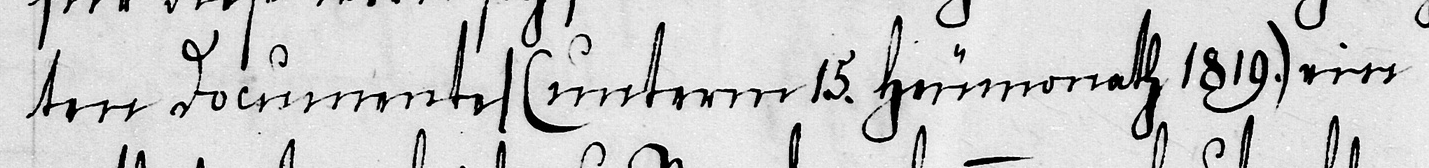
ten Documente] (unterm 15. Heumonath 1819.) ein
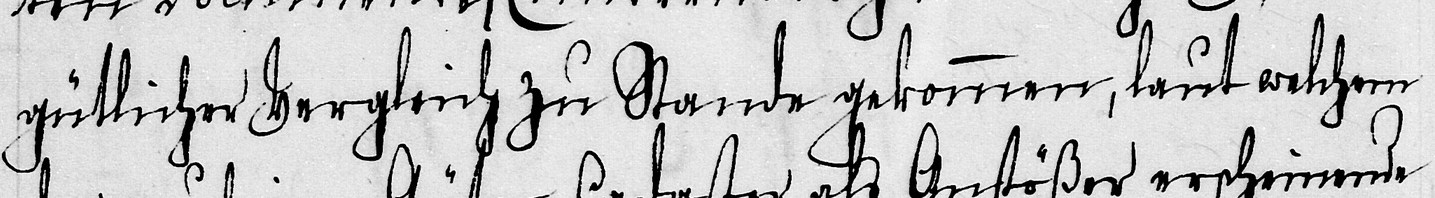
gütlicher Vergleich zu Stande gekommen, laut welchem
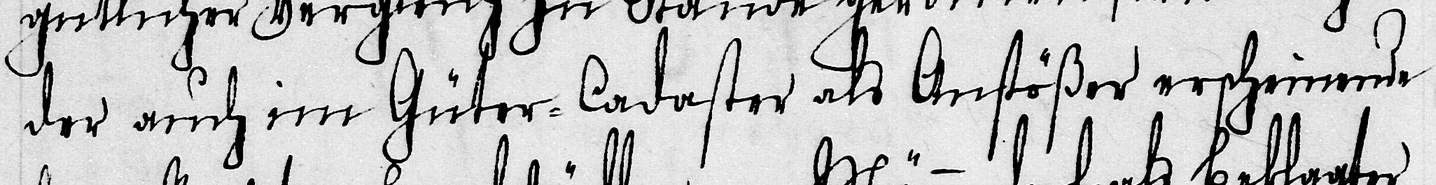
der auch im Güter-Cadaster als Anstößer erscheinende
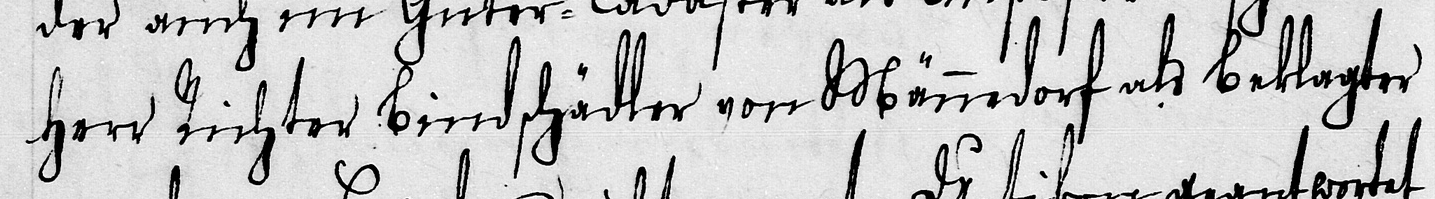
Herr Richter Bindschädler von Männedorf als Beklagter
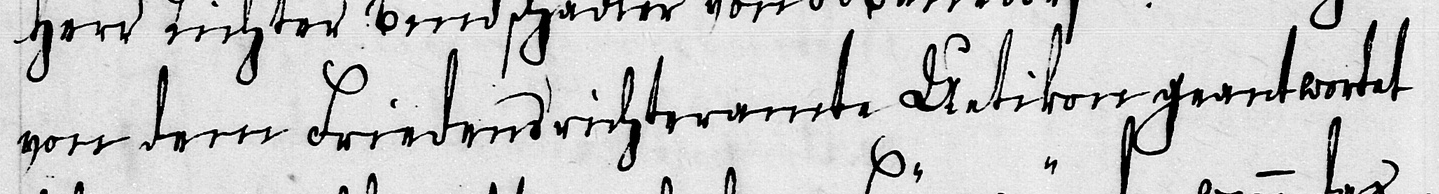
von dem Friedensrichteramte Uetikon geantwortet
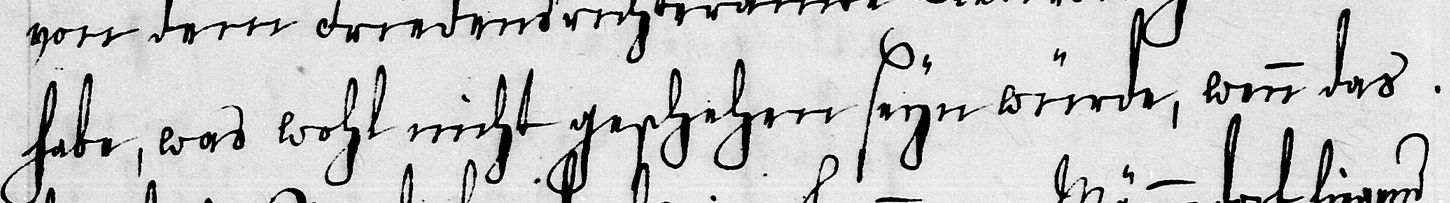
habe, was wohl nicht geschehen seyn würde, wenn das
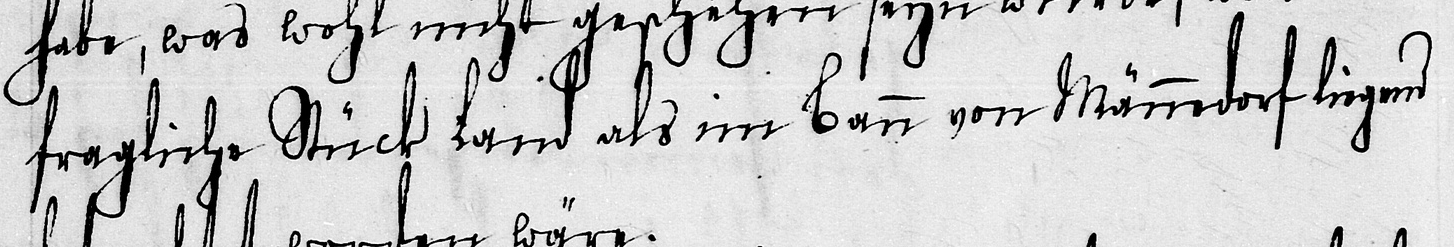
fragliche Stück Land als im Bann von Männedorf liegend
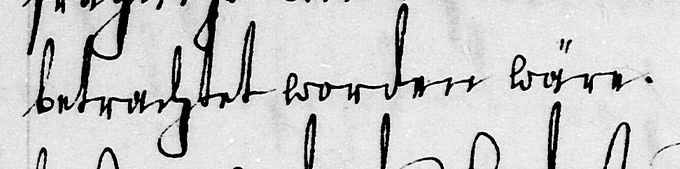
betrachtet worden wäre.
